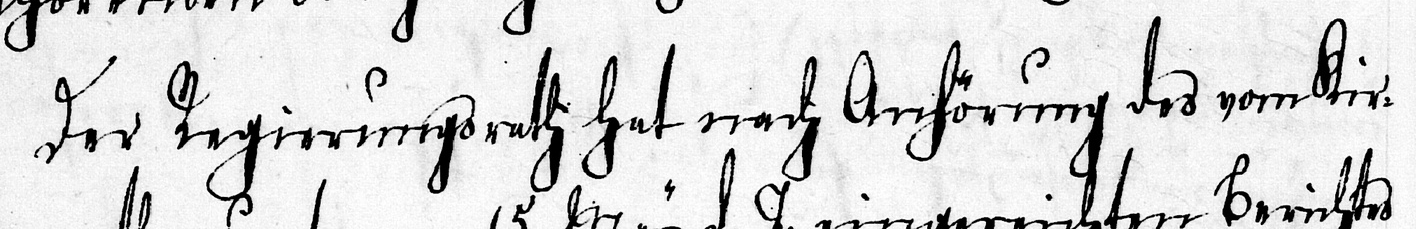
Der Regierungsrath hat nach Anhörung des vom Kir¬
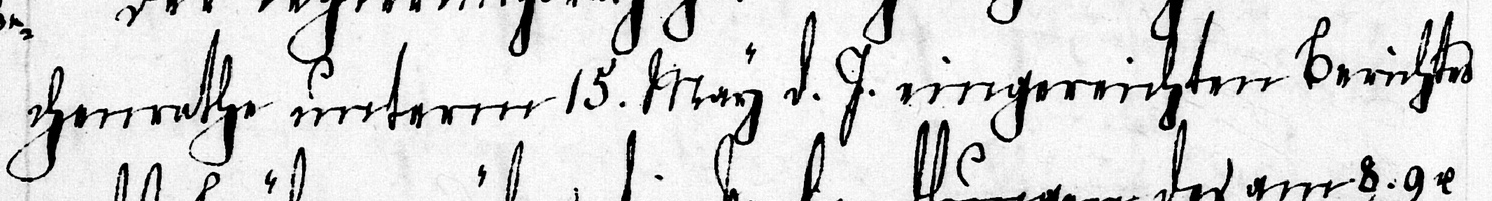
chenrathe unterm 15. May d. J. eingereichten Berichtes
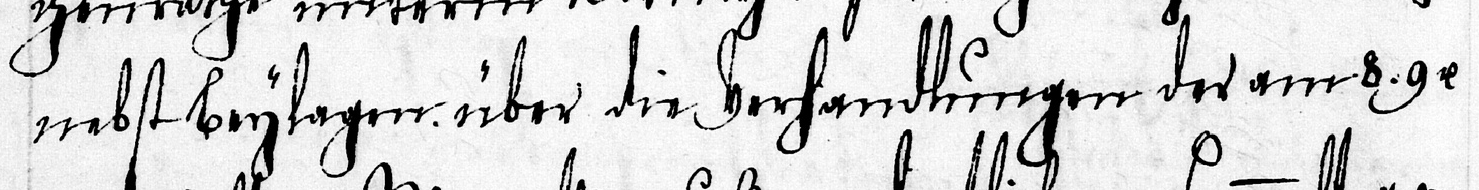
nebst Beylagen über die Verhandlungen der am 8. 9.
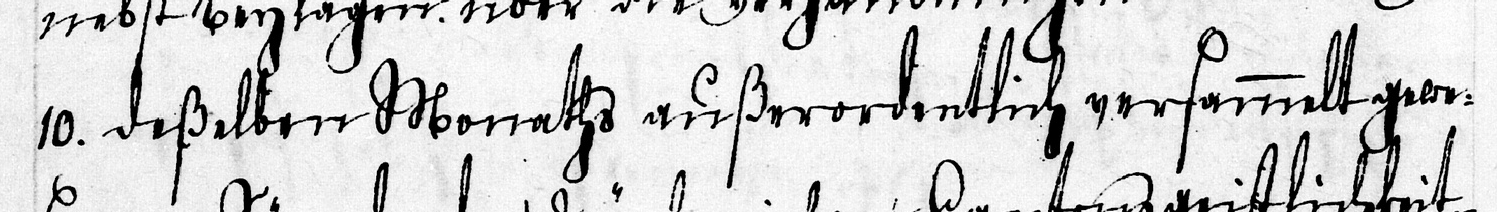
10. deßelben Monaths außerordentlich versammelt gewe¬
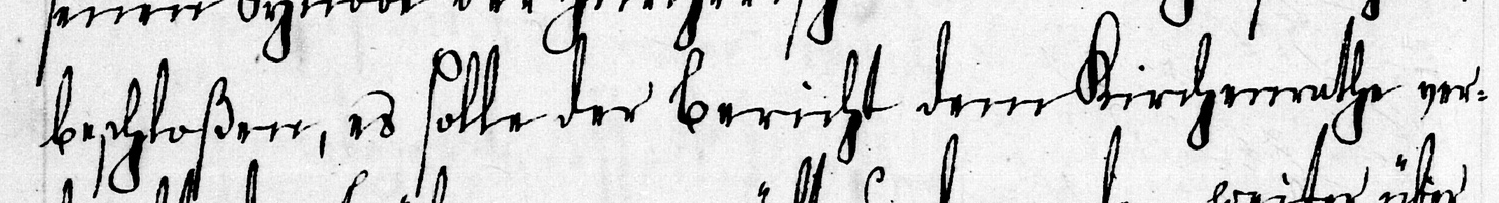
beschloßen, es solle der Bericht dem Kirchenrathe ver¬
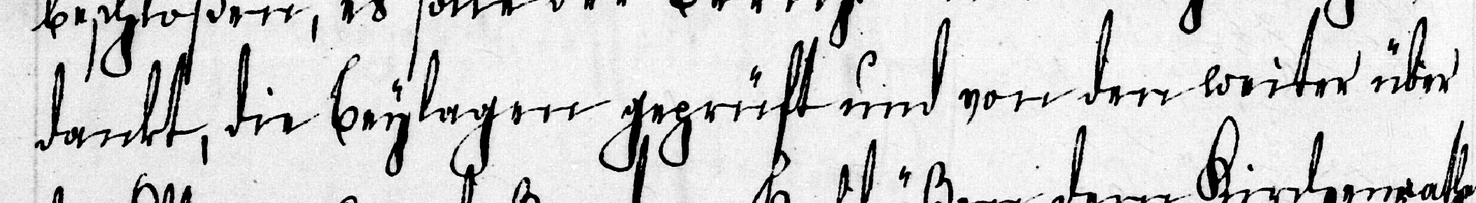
dankt, die Beylagen geprüft und von den weiter über
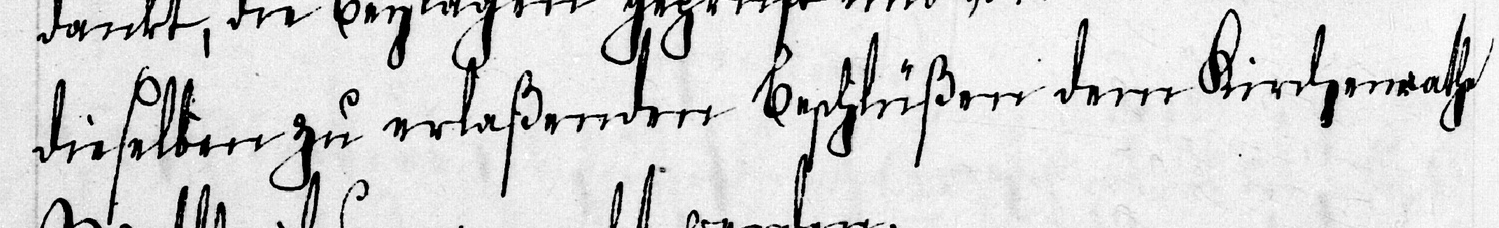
dieselben zu erlaßenden Beschlüßen dem Kirchenrathe
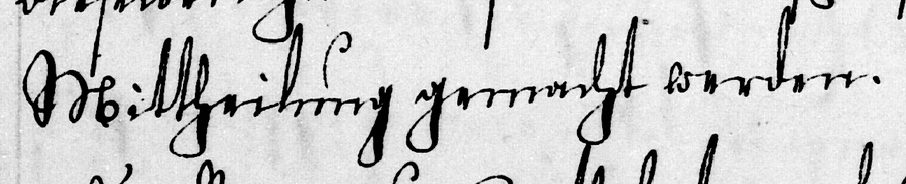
Mittheilung gemacht werden.
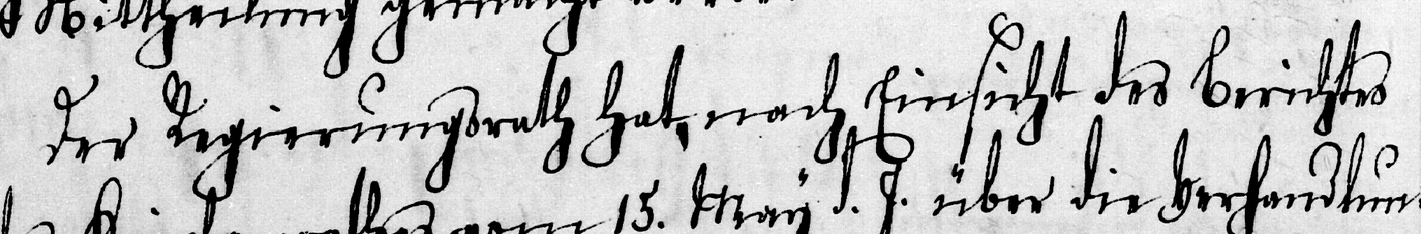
Der Regierungsrath hat, nach Einsicht des Berichtes
